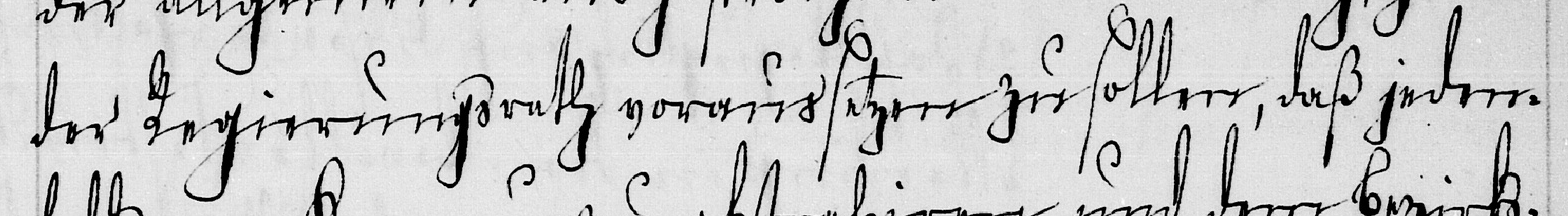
der Regierungsrath voraussetzen zu sollen, daß jeden¬
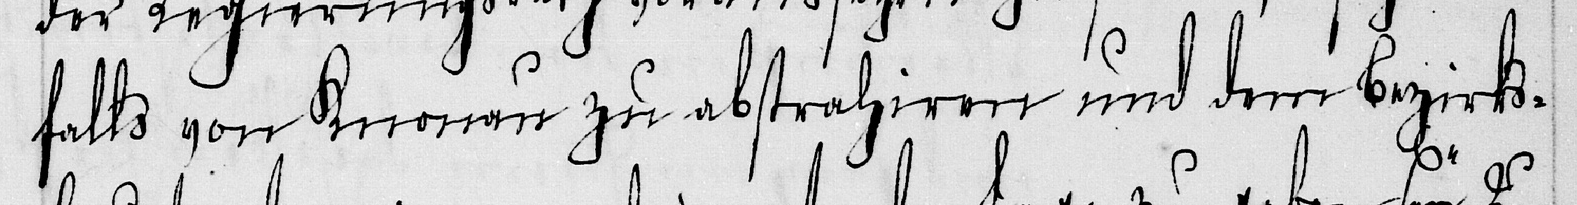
falls von Knonau zu abstrahiren und dem Bezirks¬
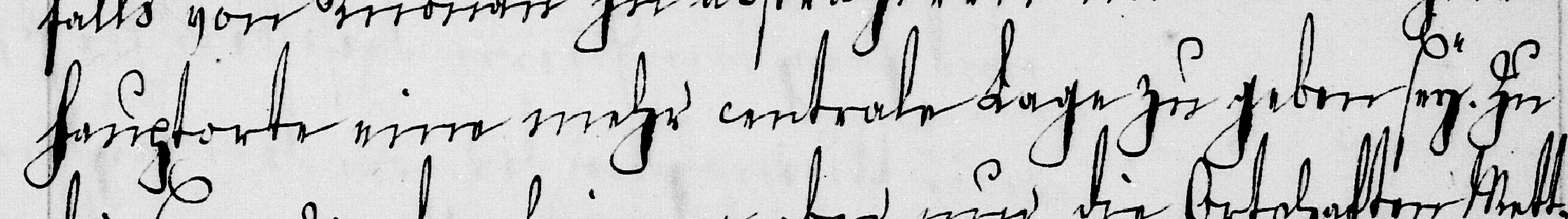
hauptorte eine mehr centrale Lage zu geben sey. Zu
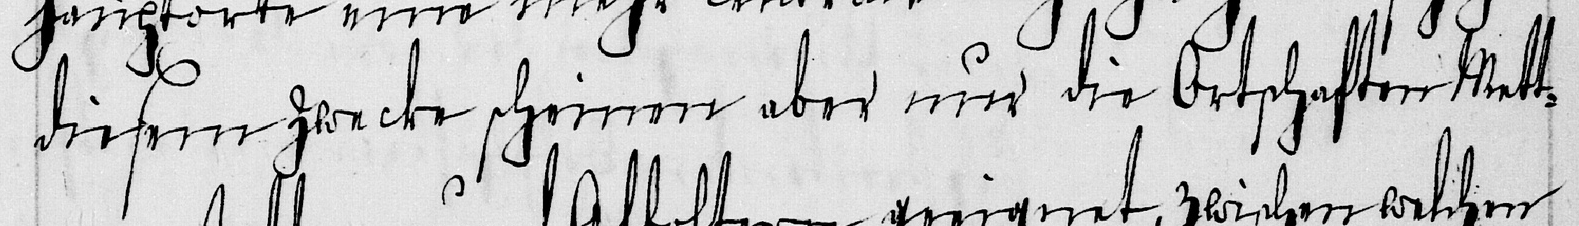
diesem Zwecke scheinen aber nur die Ortschaften Mett¬
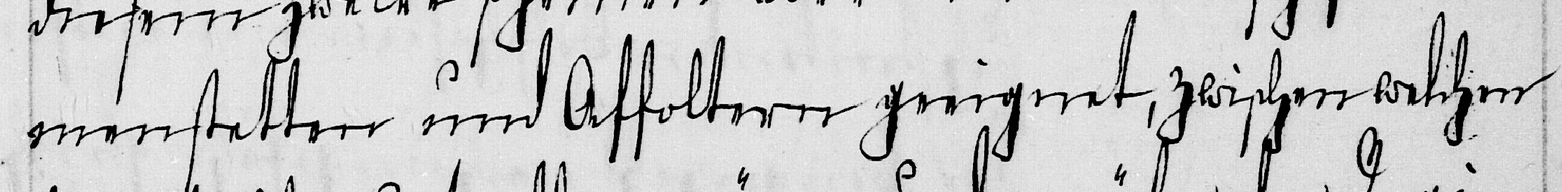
menstetten und Affoltern geeignet, zwischen welchen
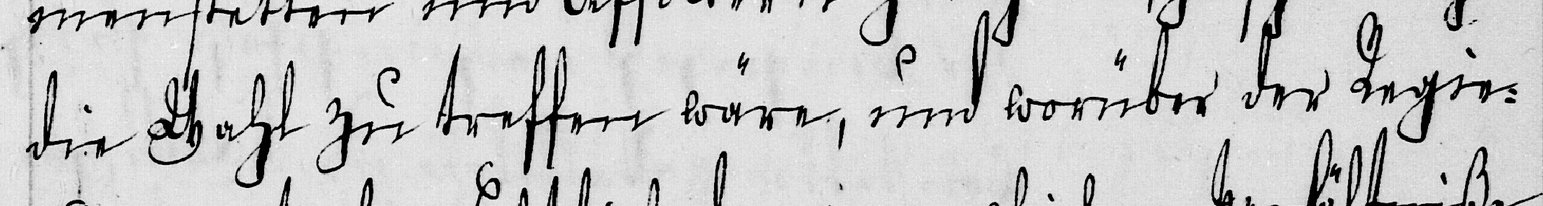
die Wahl zu treffen wäre, und worüber der Regie¬
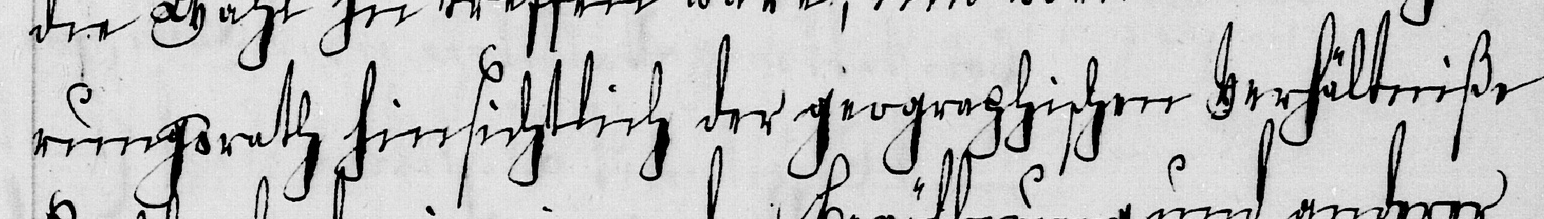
rungsrath hinsichtlich der geographischen Verhältniße
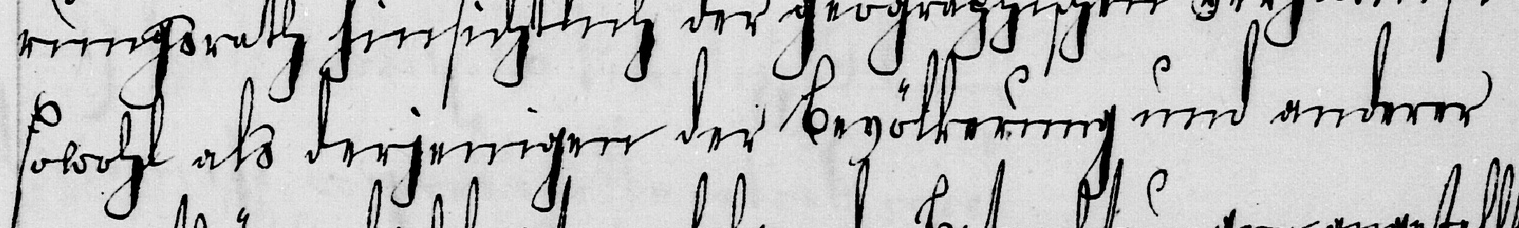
sowohl als derjenigen der Bevölkerung und anderer
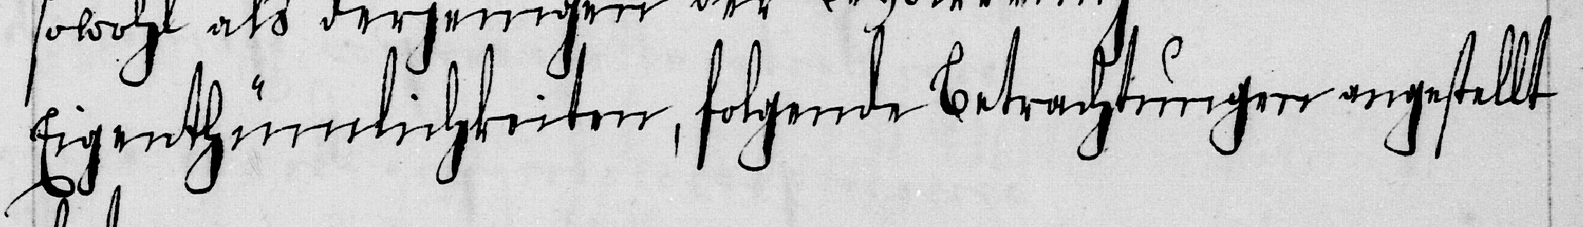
Eigenthümlichkeiten, folgende Betrachtungen angestellt
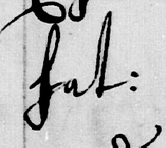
hat:
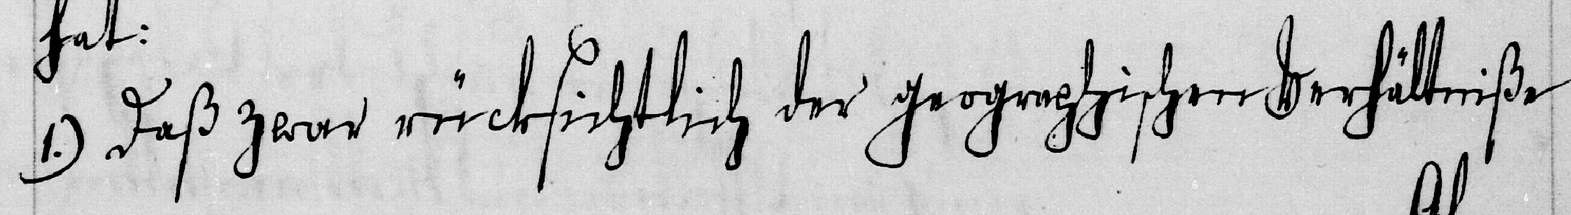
1.) Daß zwar rücksichtlich der geographischen Verhältniße
